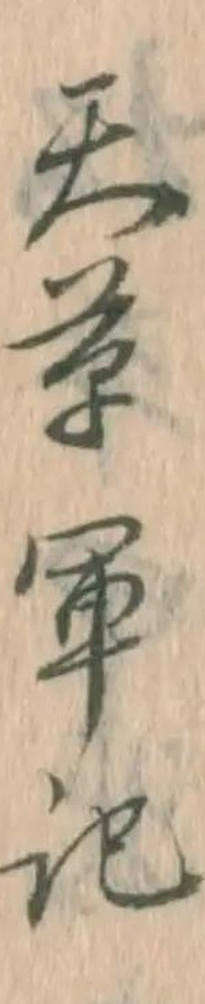天草軍記
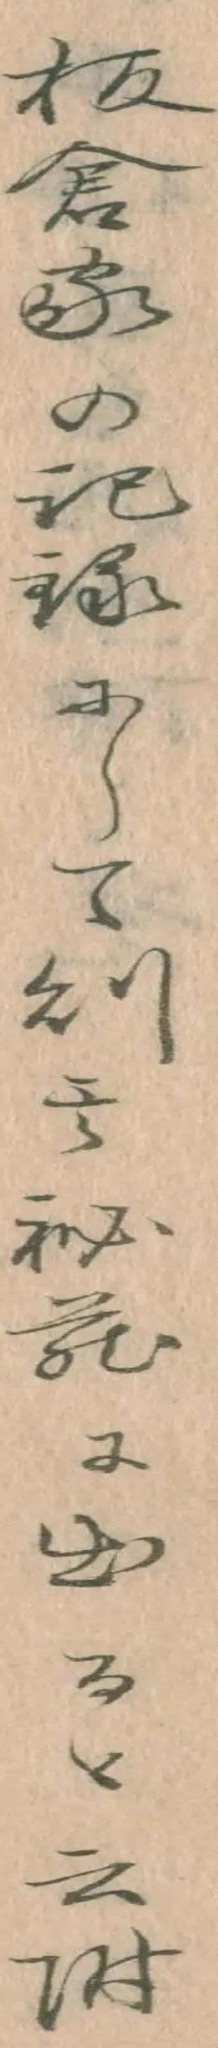板倉家の記録にして則其秘蔵に出ると云附
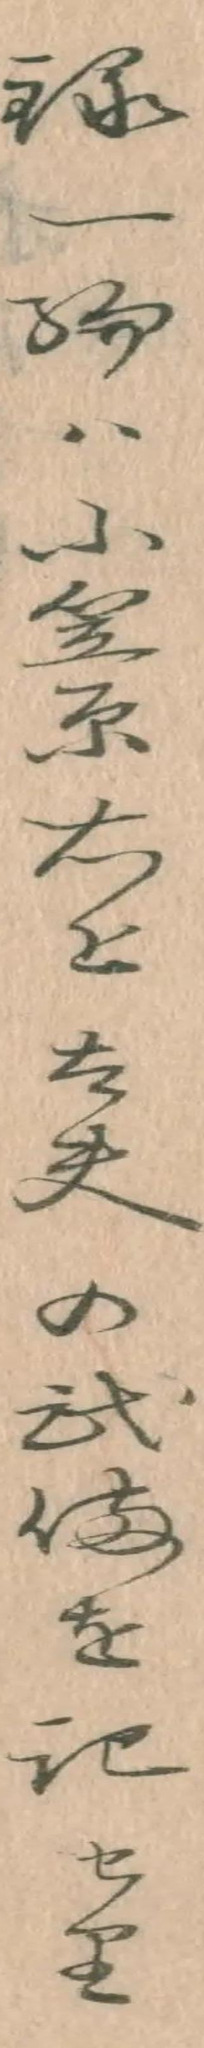録一編は小笠原右近太夫の武備を記せり
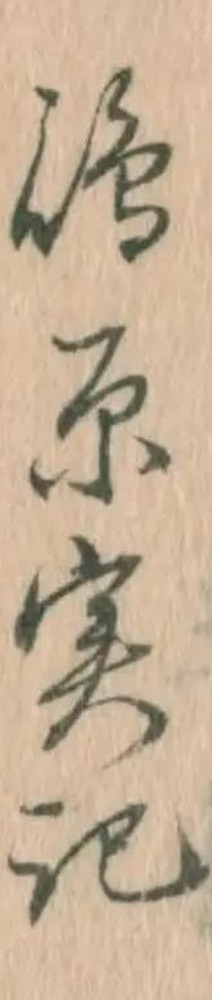島原実記
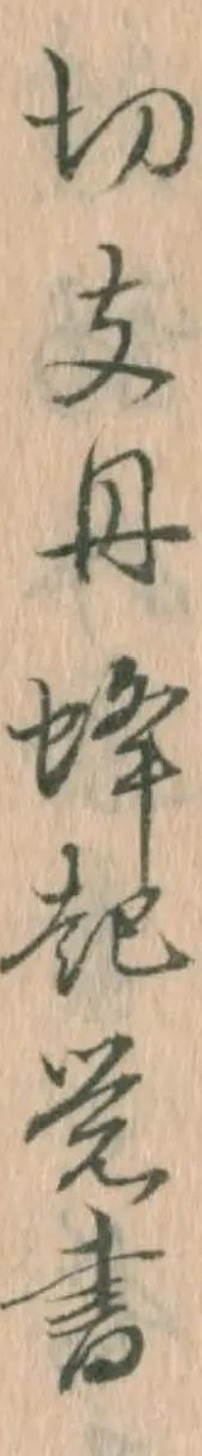切支丹蜂起覚書
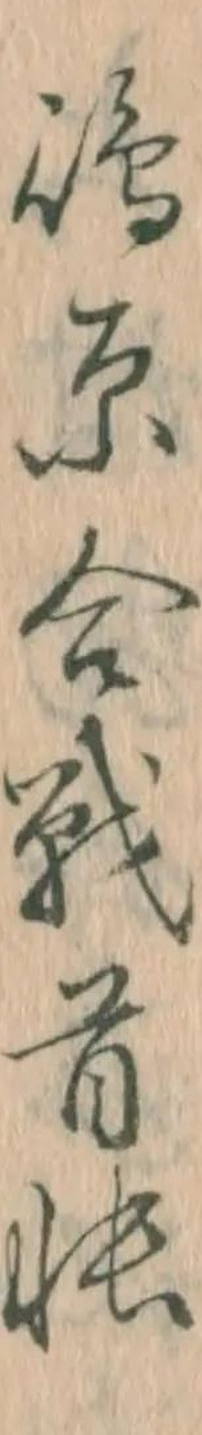島原合戦首帳
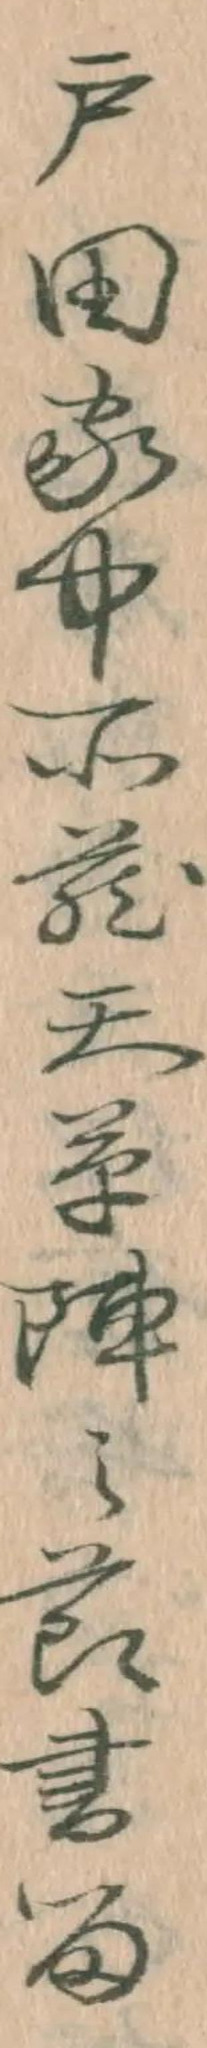戸田家中所蔵天草陣之節書留
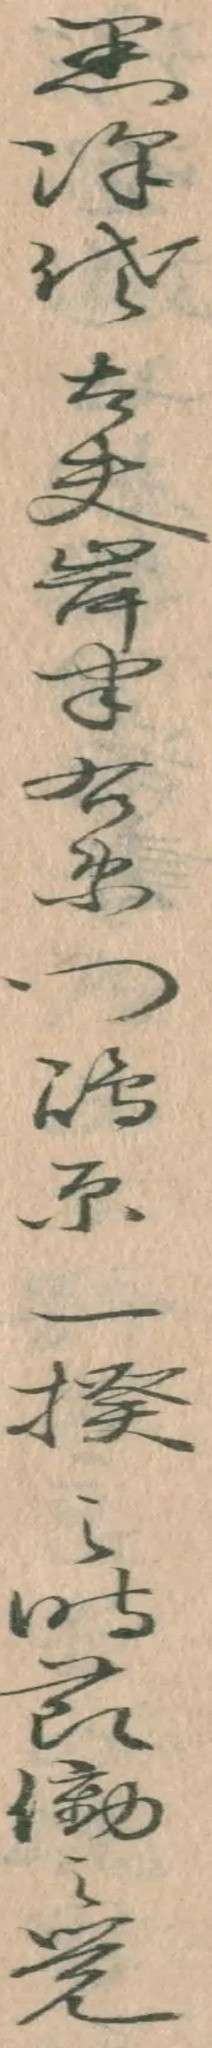黒沢佐太夫岸半右衛門島原一揆之時節働之覚
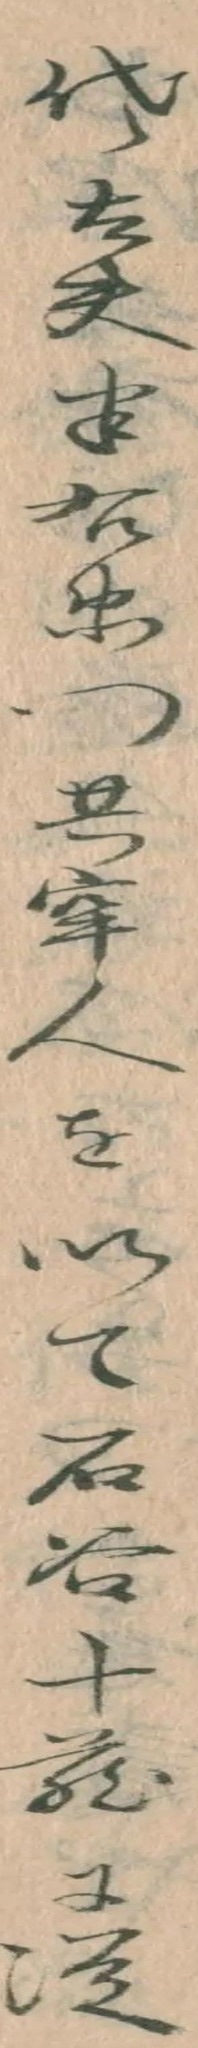佐太夫半右衛門共牢人を以て石谷十蔵に従
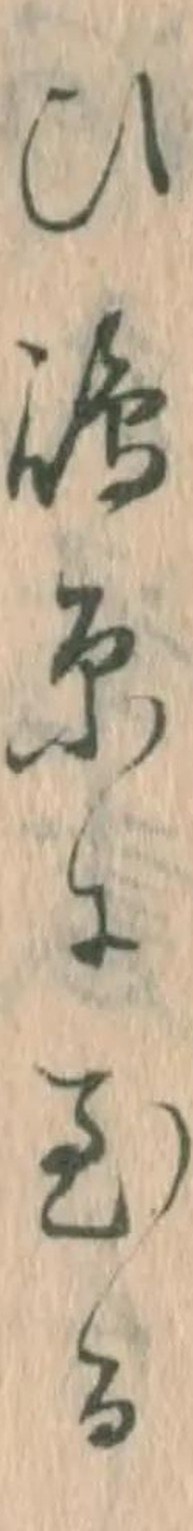ひ島原に至る
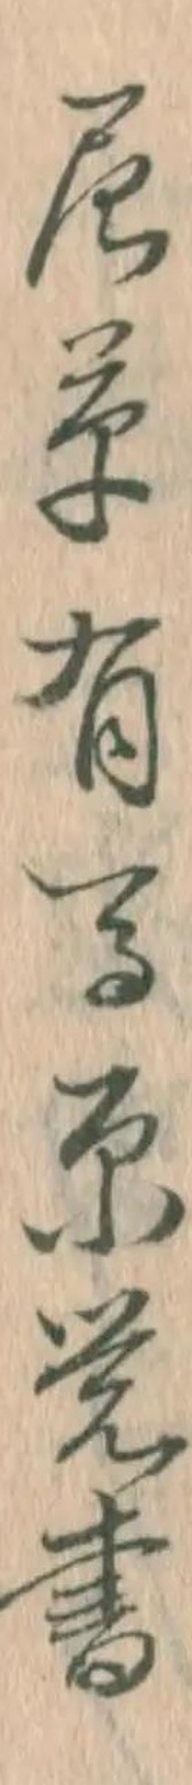尼草有馬原覚書
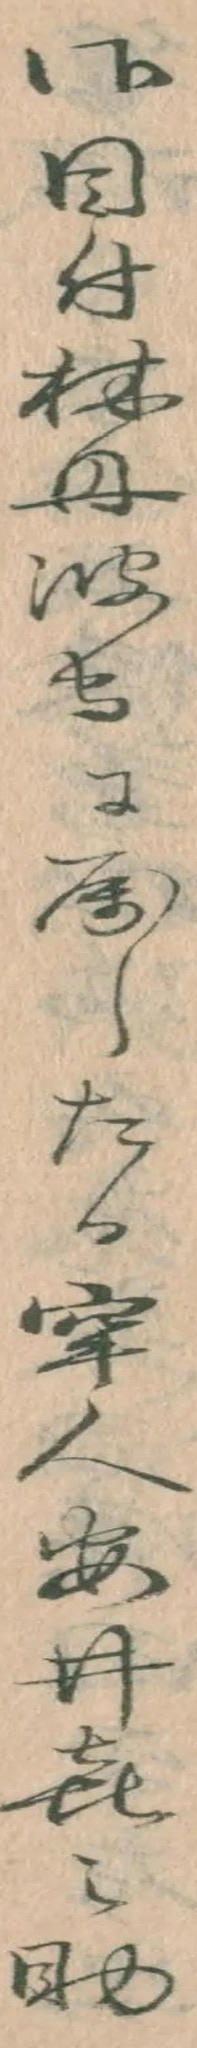御目付林丹波守に属したる牢人安井喜之助
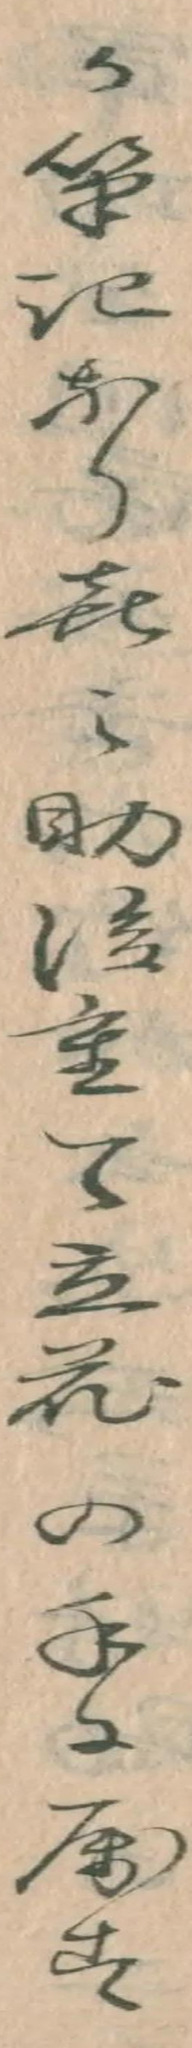か筆記なり喜之助後重て立花の手に属す
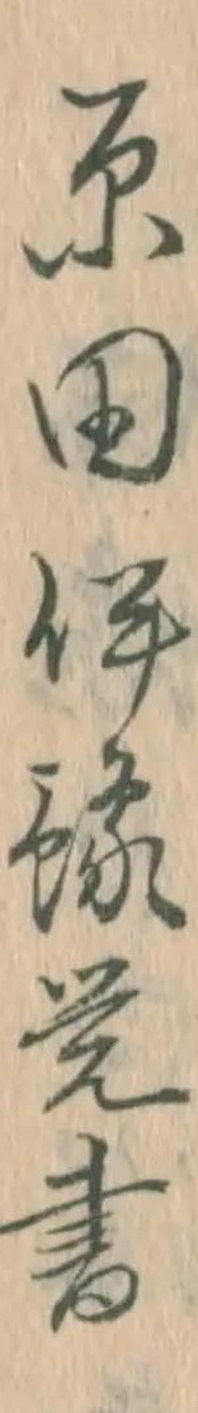原田伊予覚書

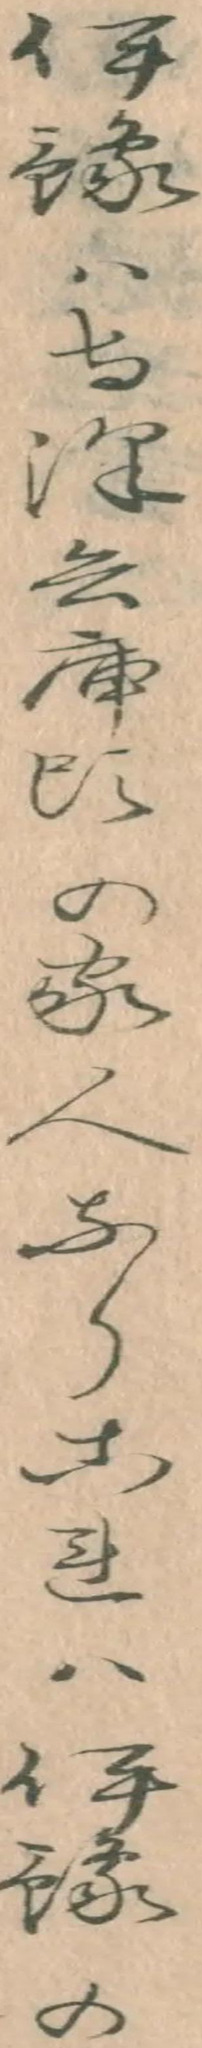伊予は寺沢兵庫頭の家人なりこれは伊予の
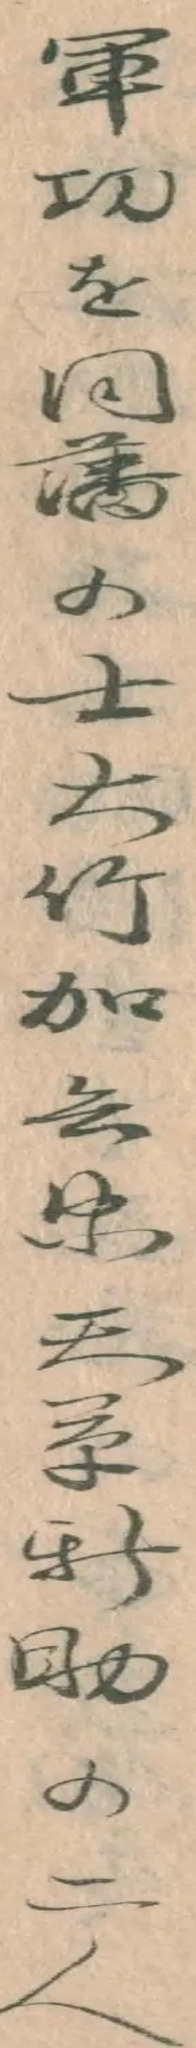軍功を同藩の士大竹加兵衛天草新助の二人
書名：切支丹御退治記 49巻. [1]
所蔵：国立国会図書館 National Diet Library, JAPAN
